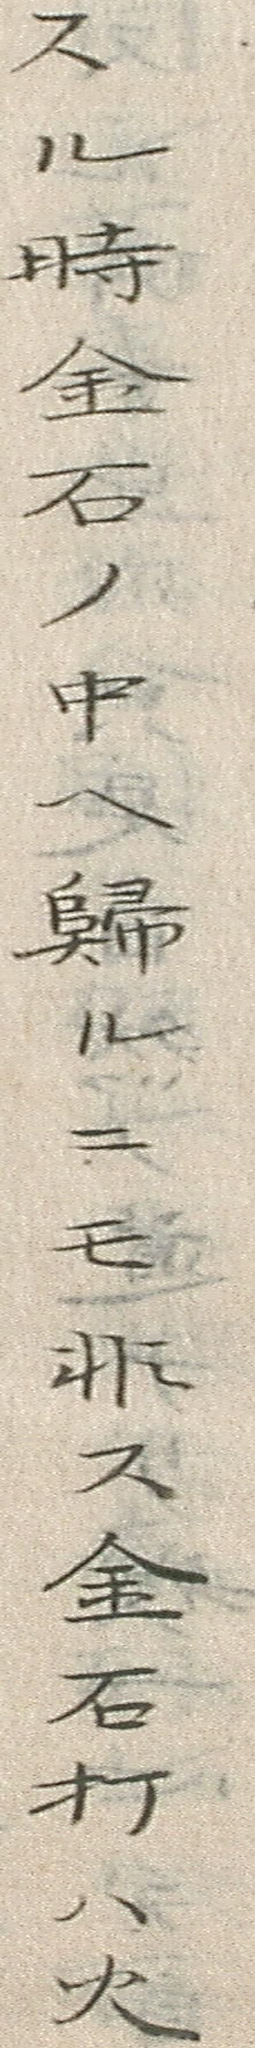スル時金石ノ中ヘ帰ルニモ非ス金石打ハ火
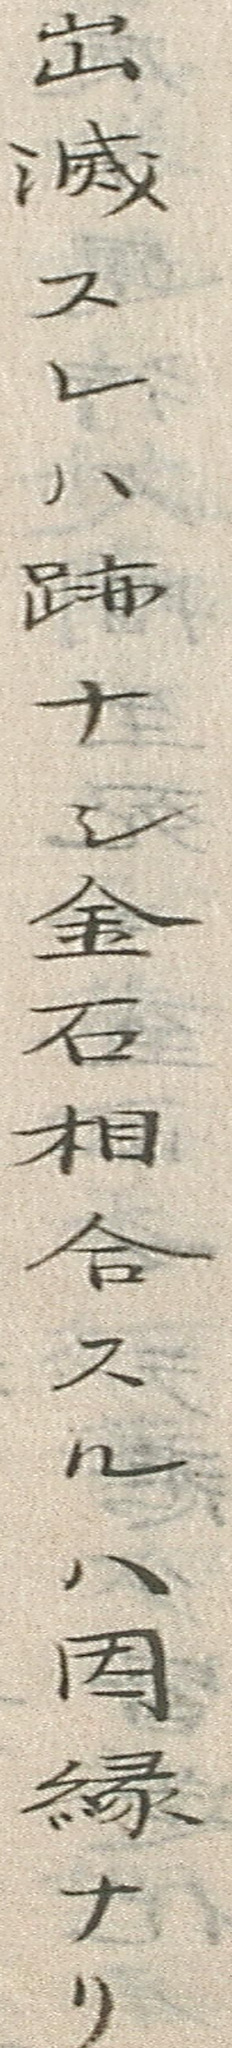出滅スレハ跡ナシ金石相合スルハ因縁ナリ
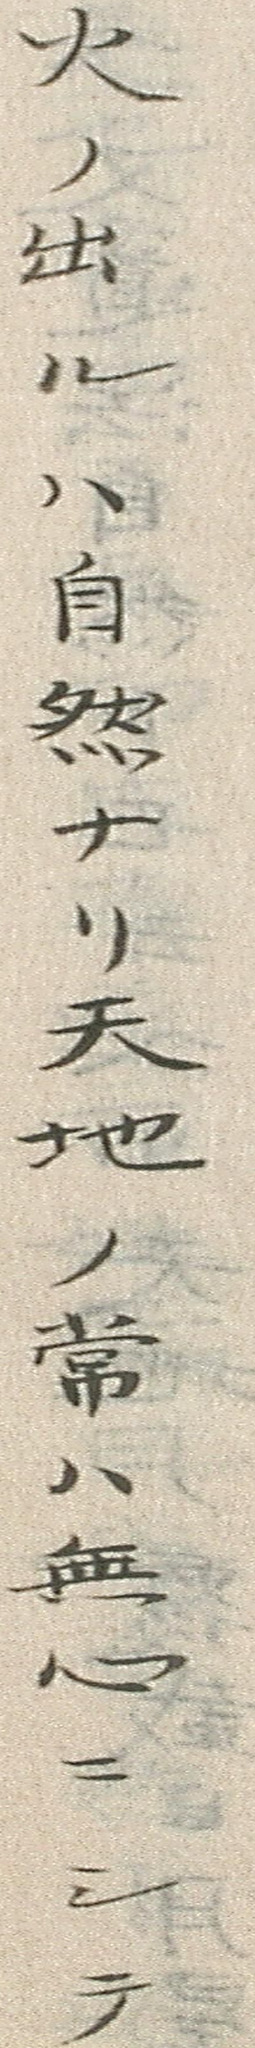火ノ出ルハ自然ナリ天地ノ常ハ無心ニシテ
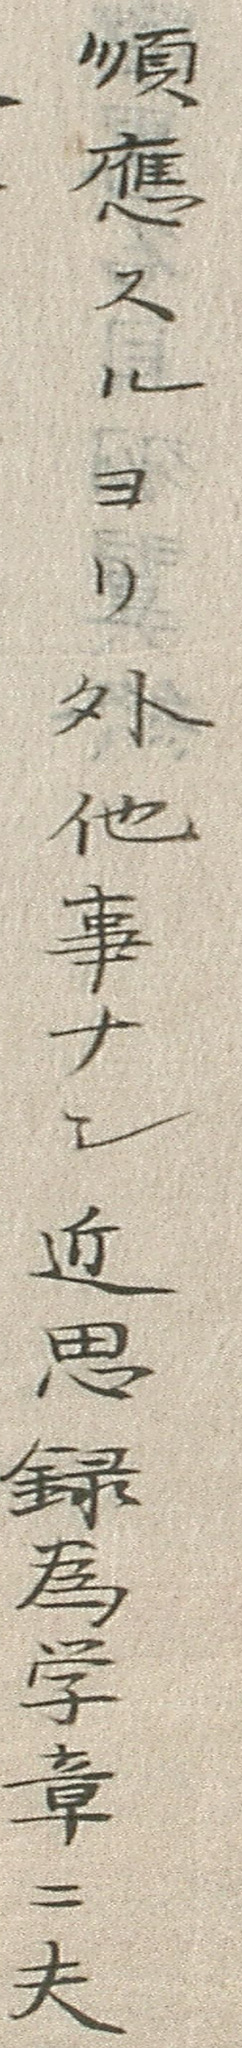順応スルヨリ外他事ナシ近思録為学章ニ夫
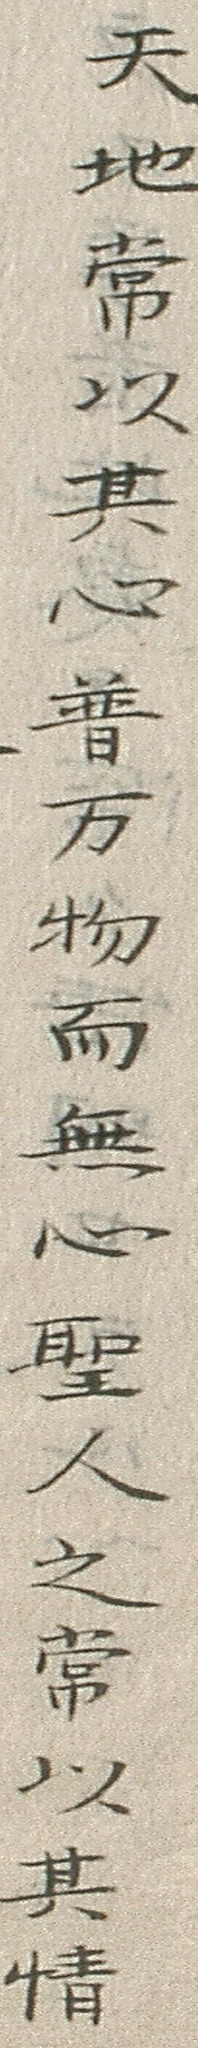天地常以其心普万物而無心聖人之常以其情
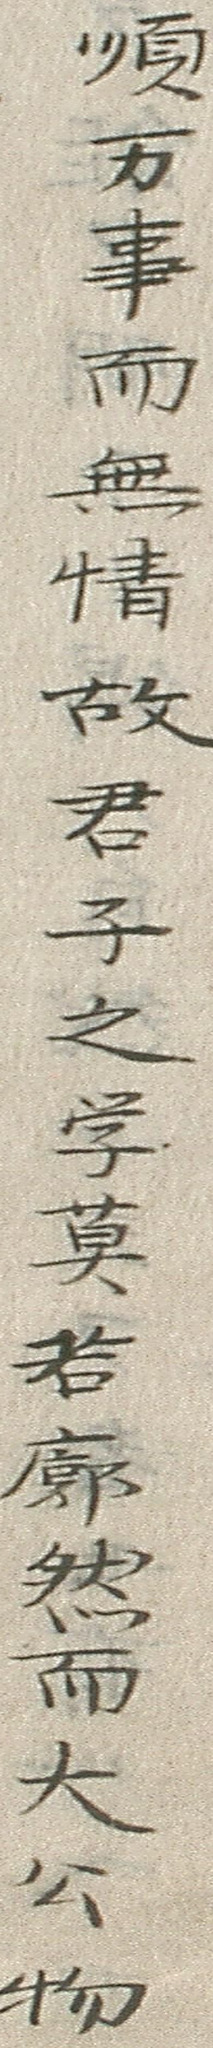順万事而無情故君子之学莫若廓然而大公物
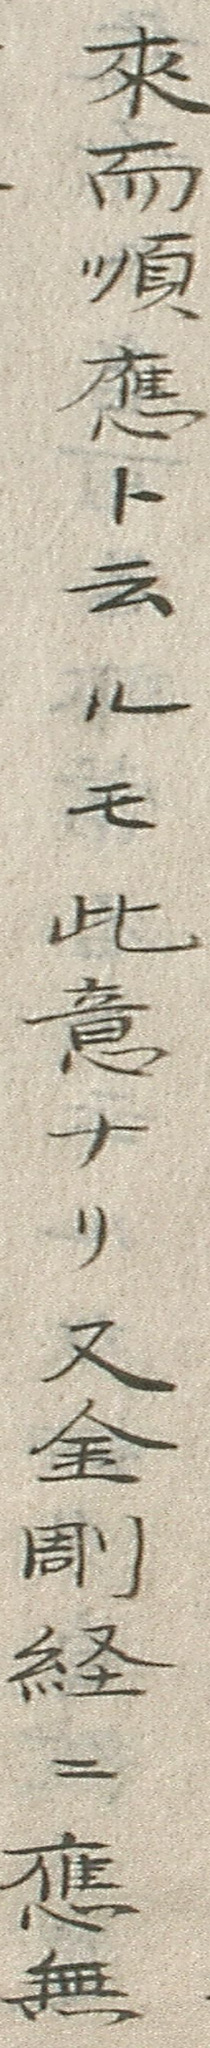来而順応ト云ルモ此意ナリ又金剛経ニ応無
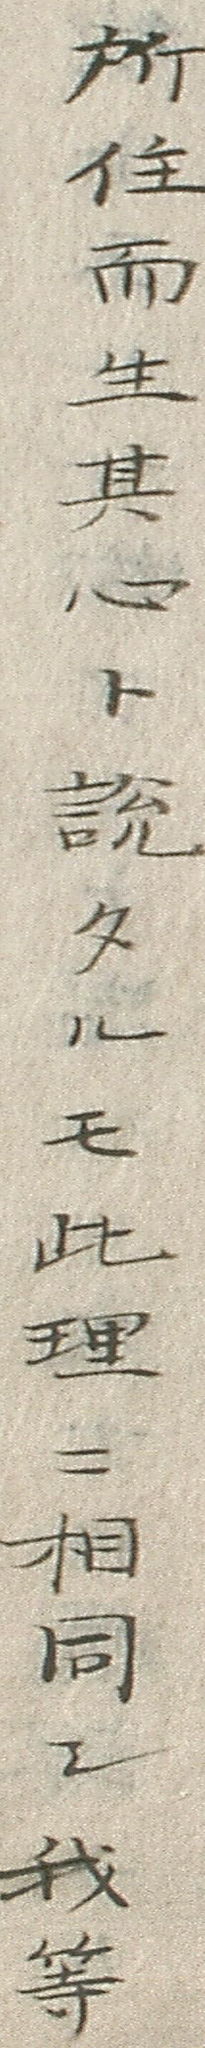所住而生其心ト説タルモ此理ニ相同シ我等
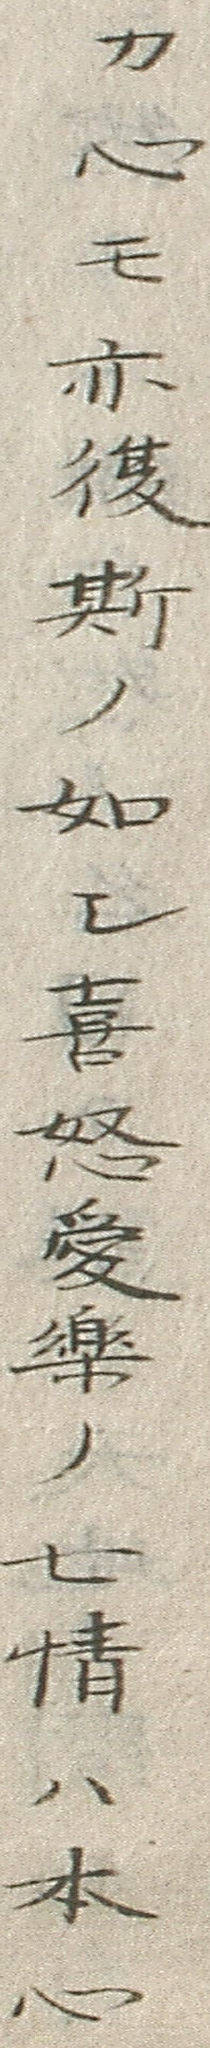カ心モ亦復斯ノ如シ喜怒愛楽ノ七情ハ本心
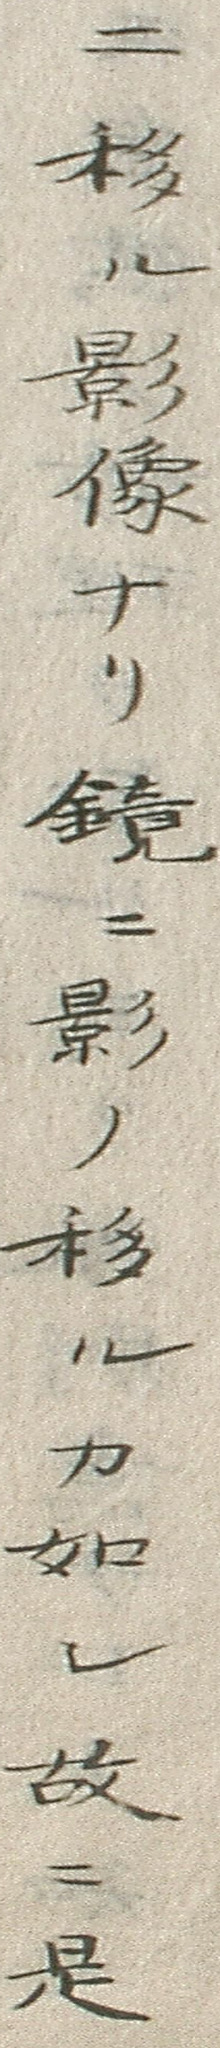ニ移ル影像ナリ鏡ニ影ノ移ルカ如シ故ニ是
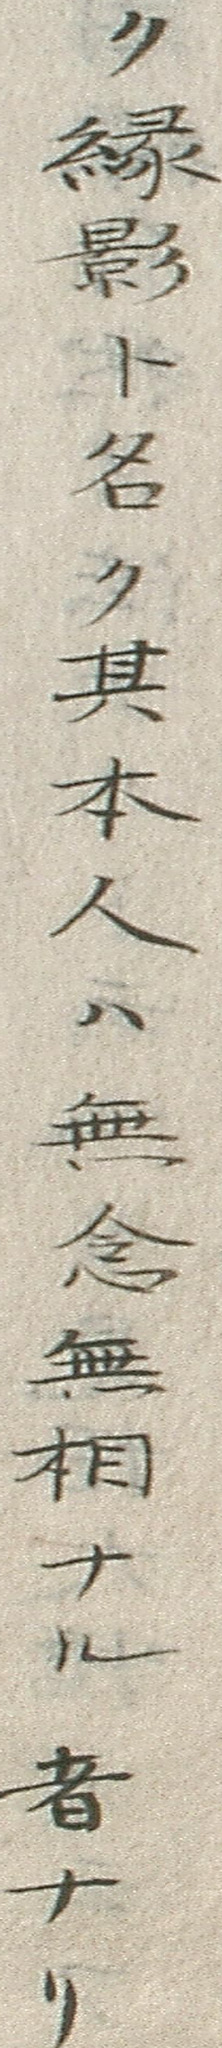ク縁影ト名ク其本人ハ無念無想ナル者ナリ
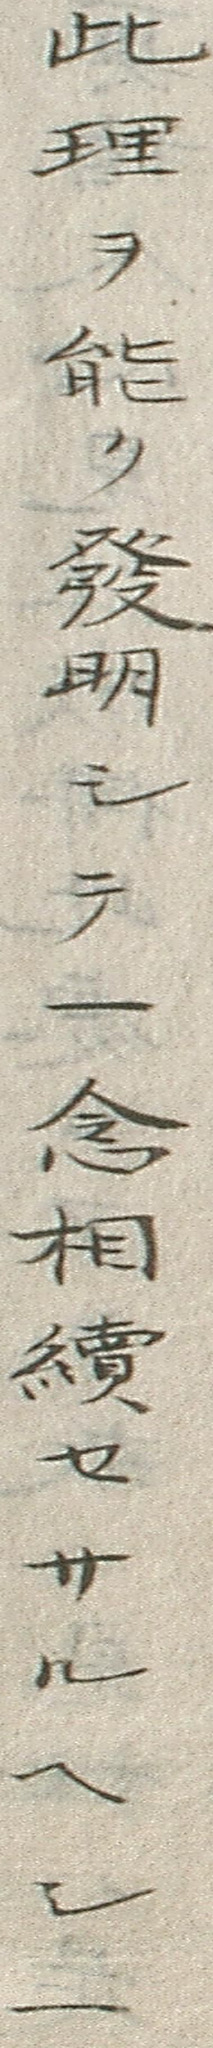此理ヲ能ク発明シテ一念相続セサルヘシ一
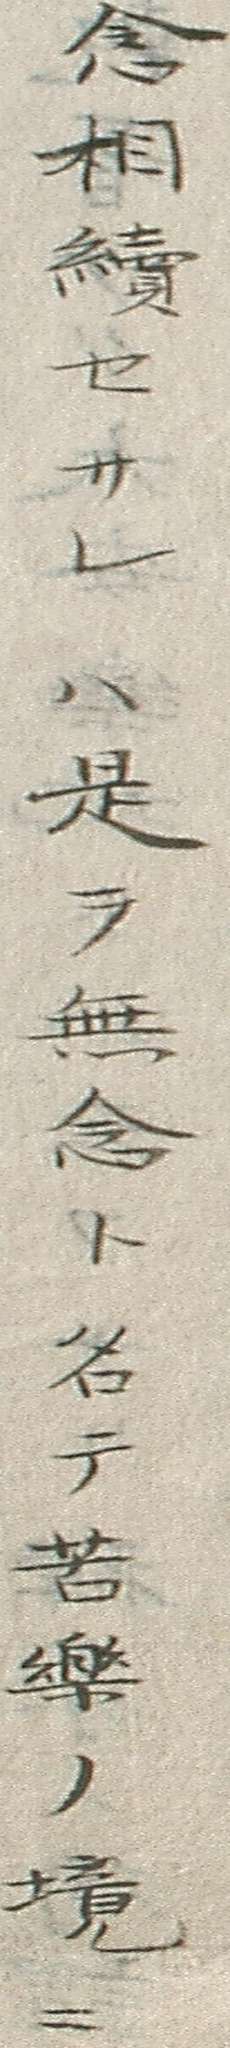念相続セザレハ是ヲ無念ト名テ苦楽ノ境ニ

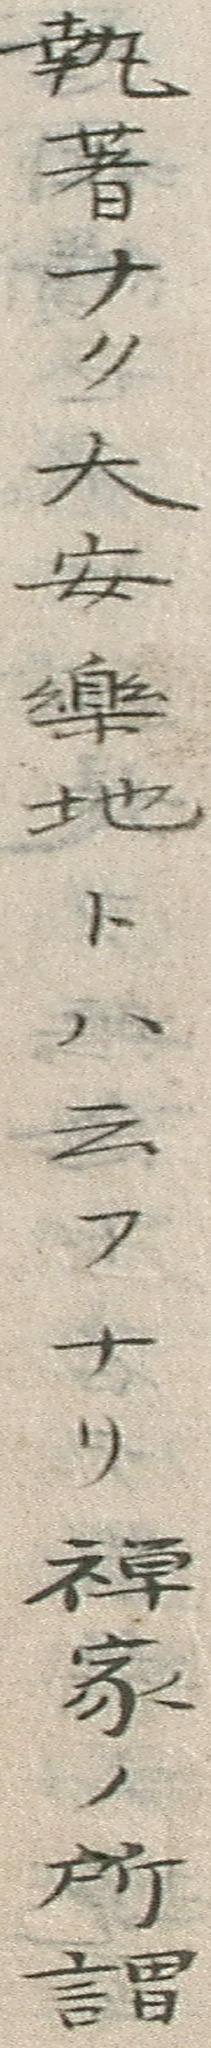執著ナク大安楽地トハ云フナリ禅家ノ所謂
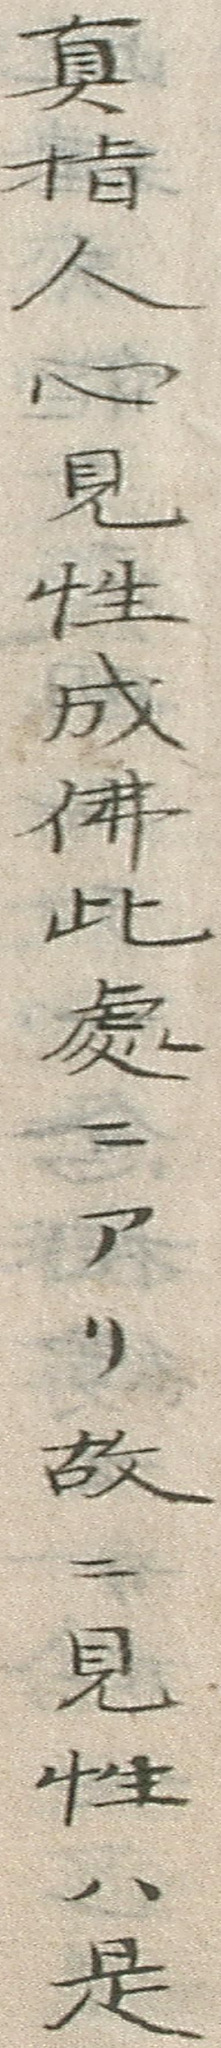真指人心見性成仏此処ニアリ故ニ見性ハ是
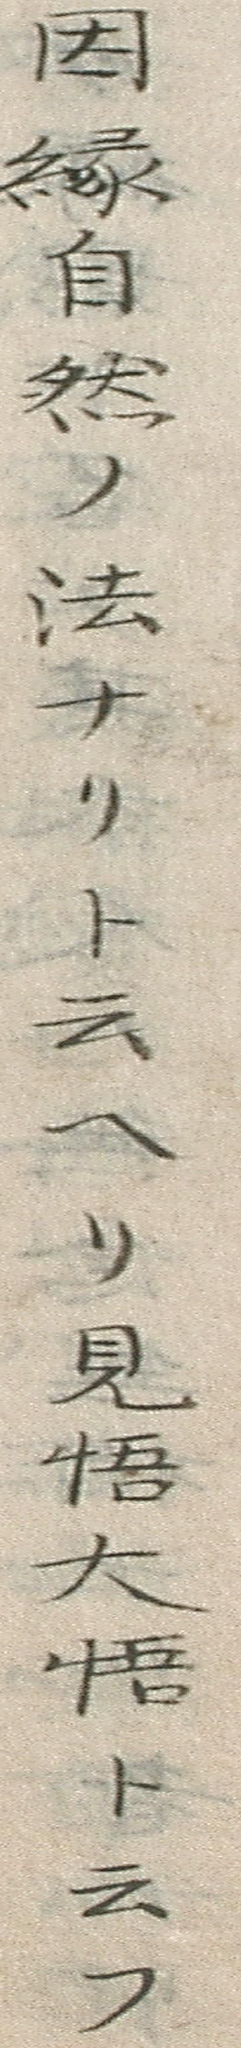因縁自然ノ法ナリト云ヘリ見悟大悟ト云フ
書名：天學略名目羽翼　全
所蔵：東京大学地震研究所図書室 Earthquake Research Institute Library, The University of Tokyo, JAPAN
